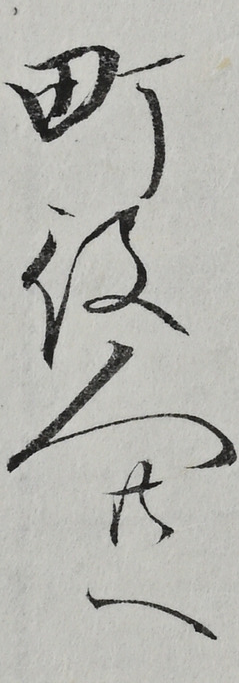町役人共へ

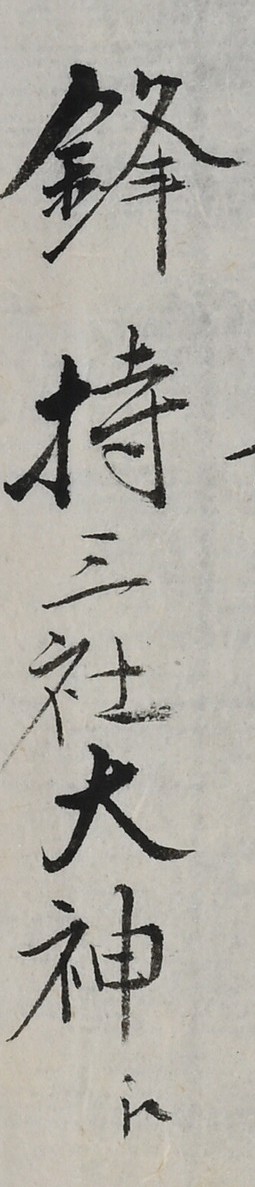鋒持三社大神江
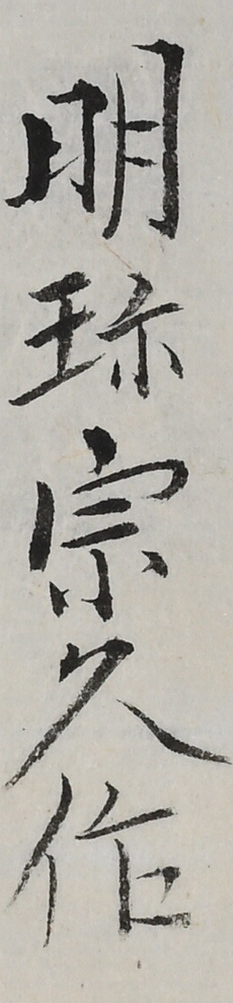明珎宗久作
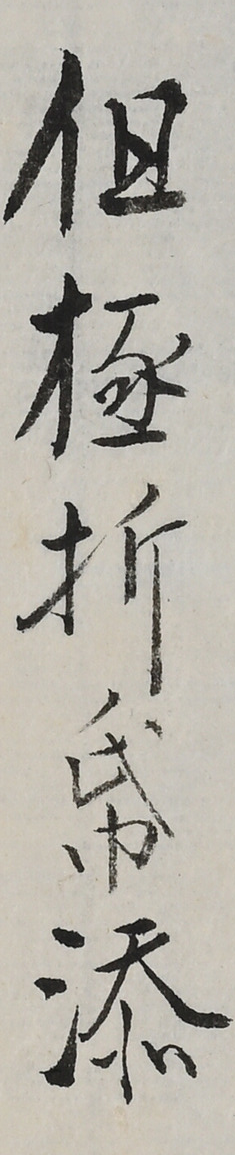但極折紙添
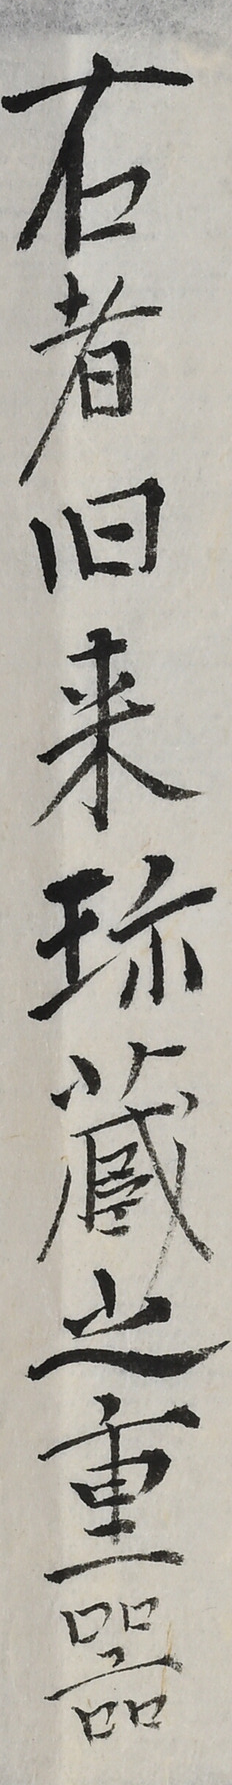右は旧来珎蔵之重器
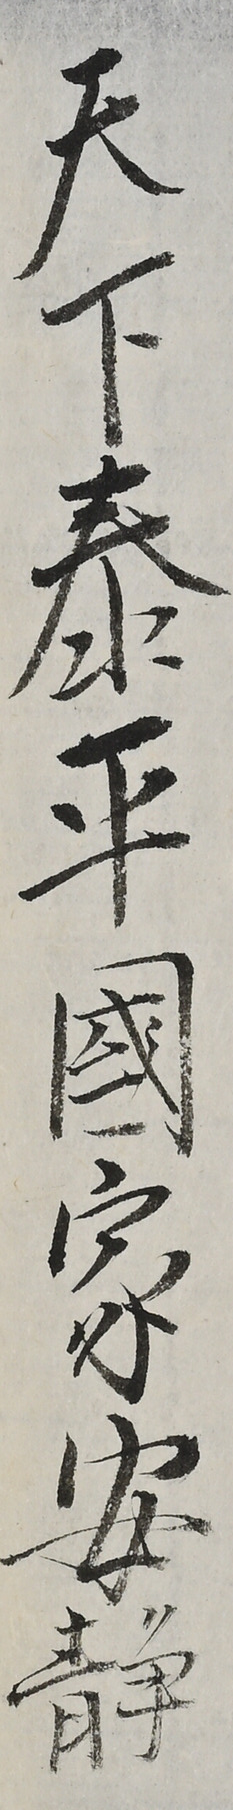天下泰平国家安静
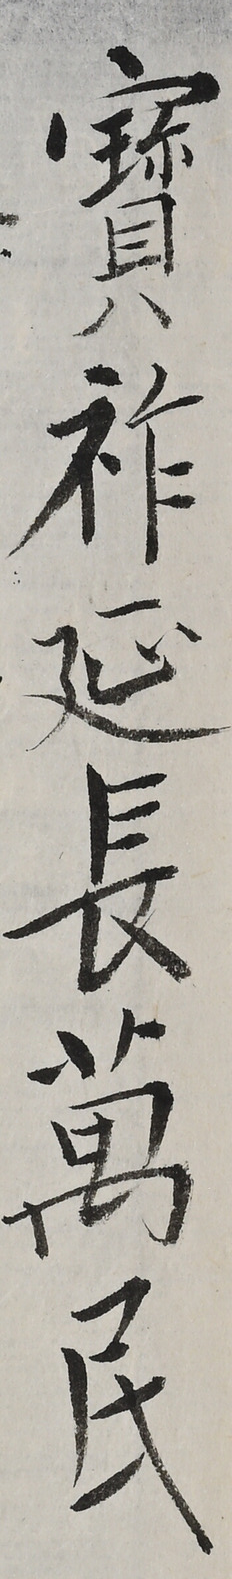宝祚延長万民
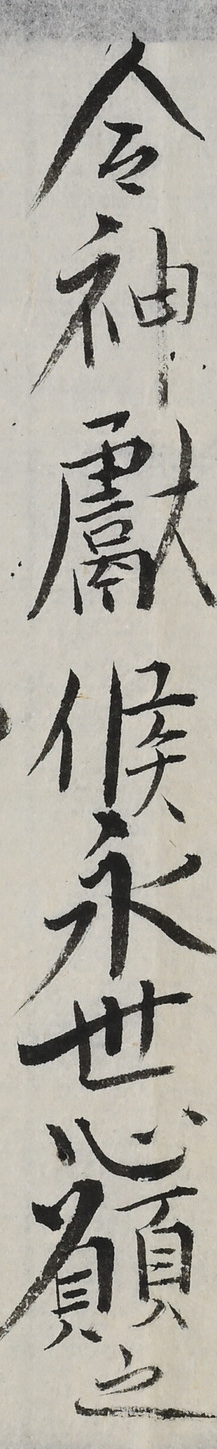令神獻候永世真心願之
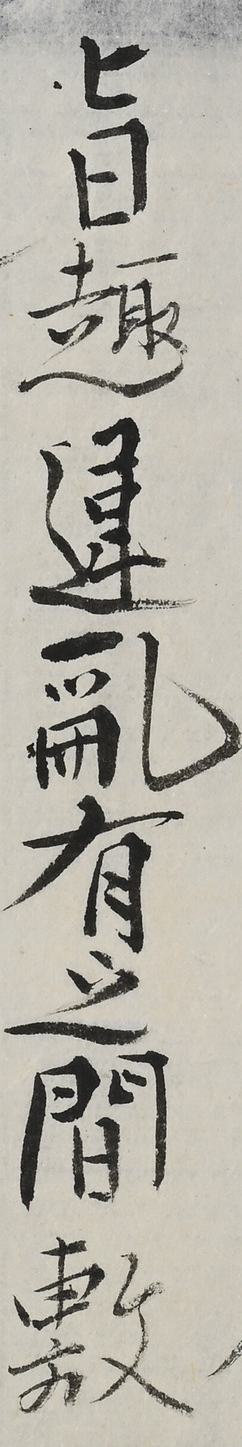旨趣違乱有之間敷
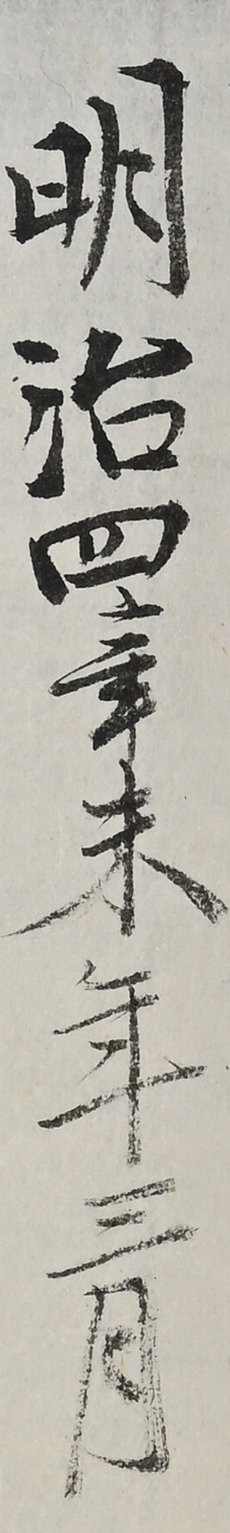明治四辛未年三月
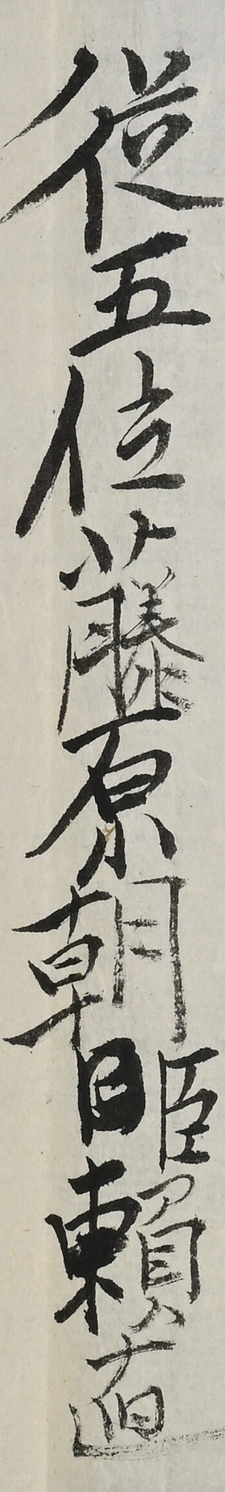従五位藤原朝臣頼直
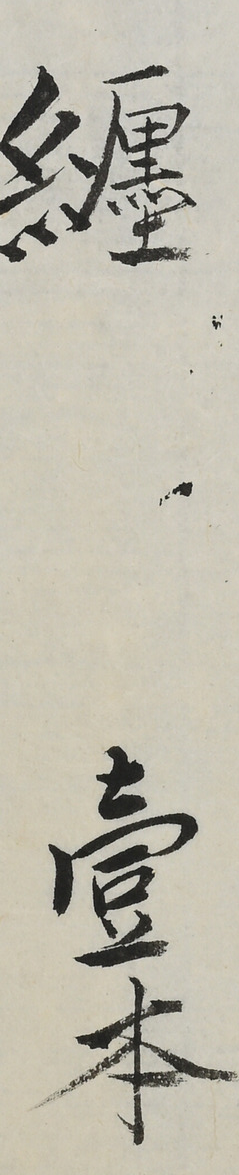纏壱本
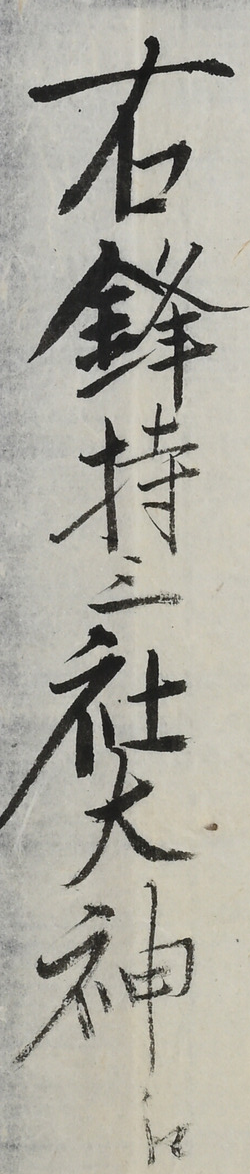一右鋒持三社大神江

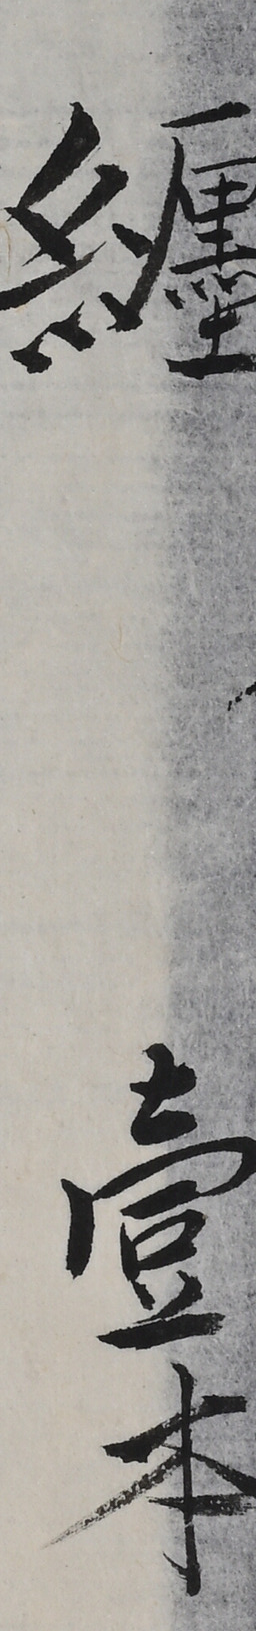纏壱本
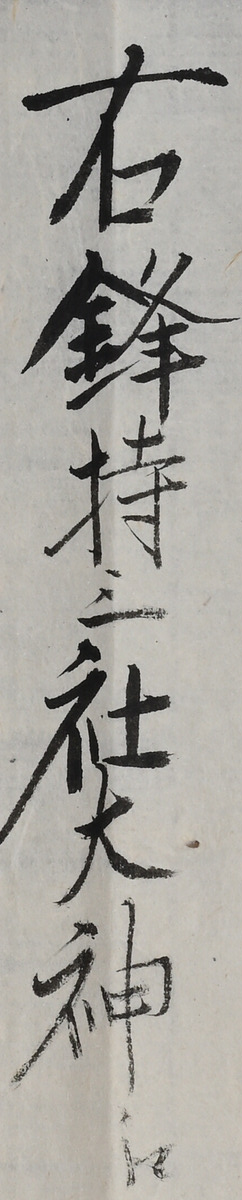一右鋒持三社大神江
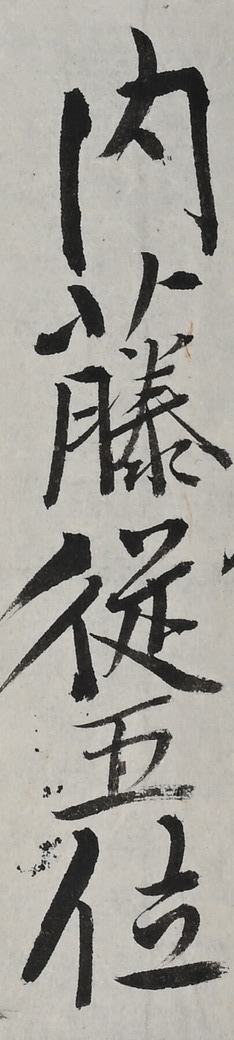内藤従五位
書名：記
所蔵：伊那市立高遠町図書館・合同会社AMANE
